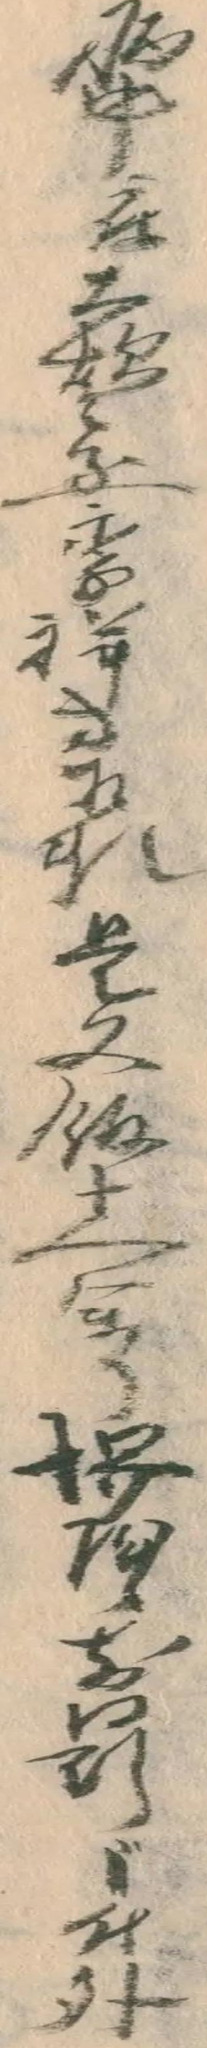病中ニ付大炊之丞季祥方相頼是又飯十人余り堺屋へ前同断申付外
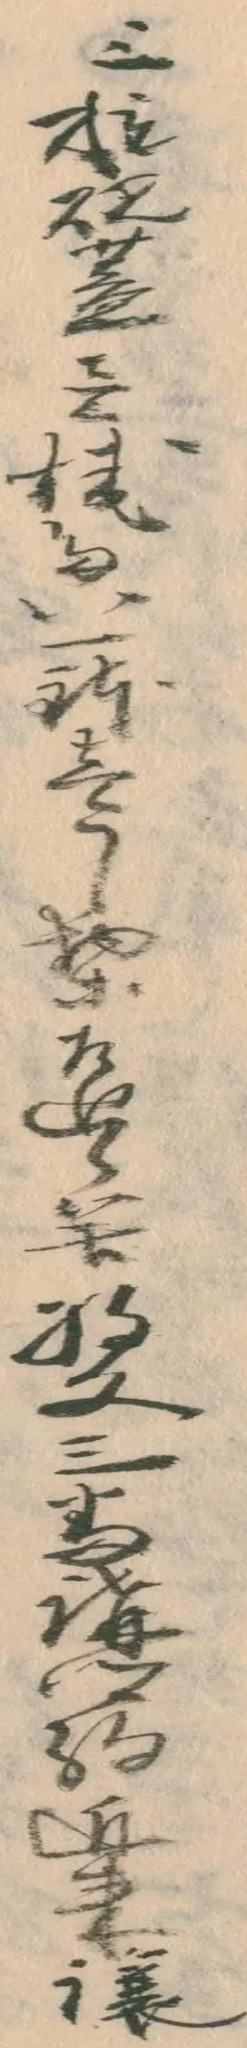三拾硯蓋壱株たい一鉢ひたし物等相廻り筈将又三番講郷約近来譲
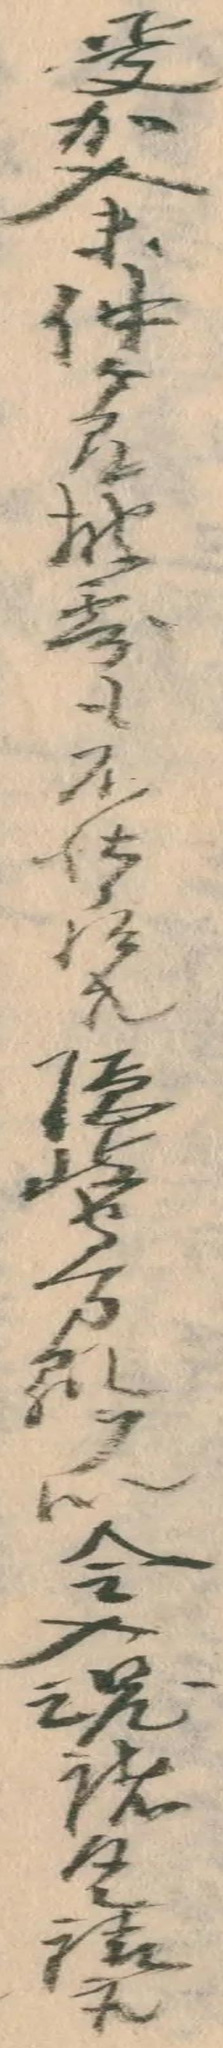受加入未仲ヶ間披露も不仕候得共隠岐守万顕ヲ以令入魂諸具請取
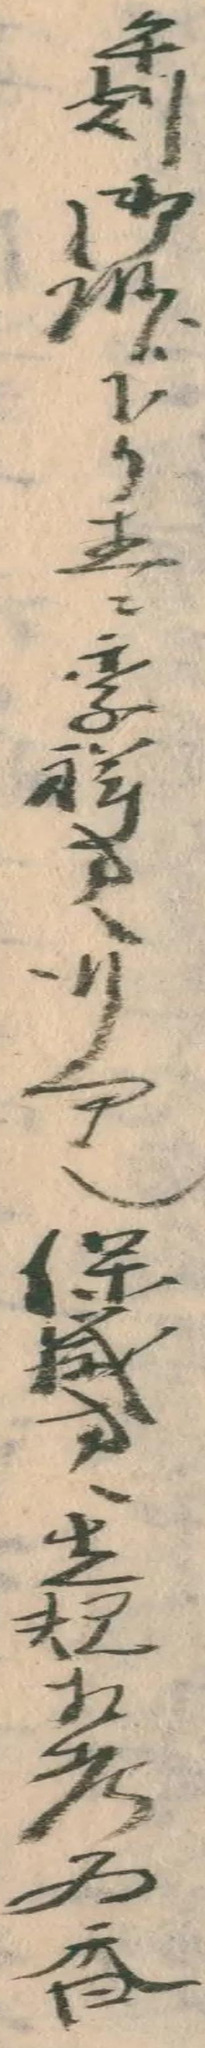午刻御殿ゟ下り直ニ季祥方へ行向也保歳方へ先規相考為香
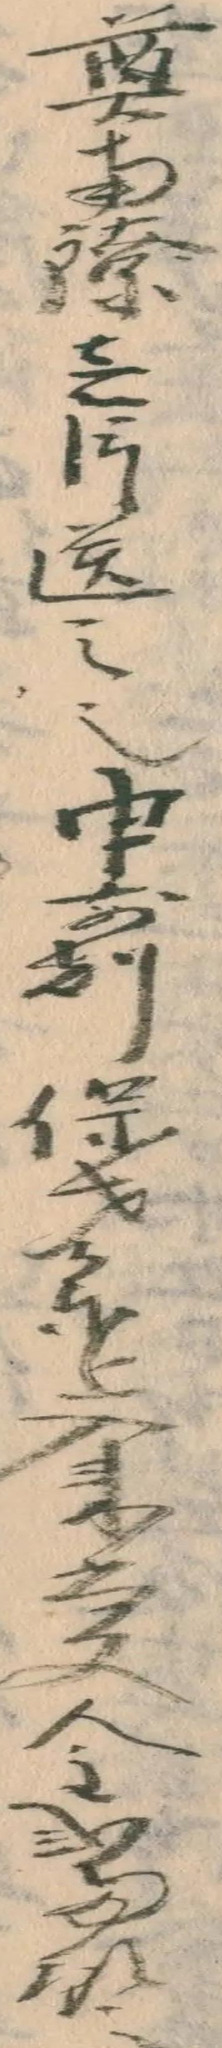奠南鐐壱片送之也申前刻保才参上入来尚又金弐両預之
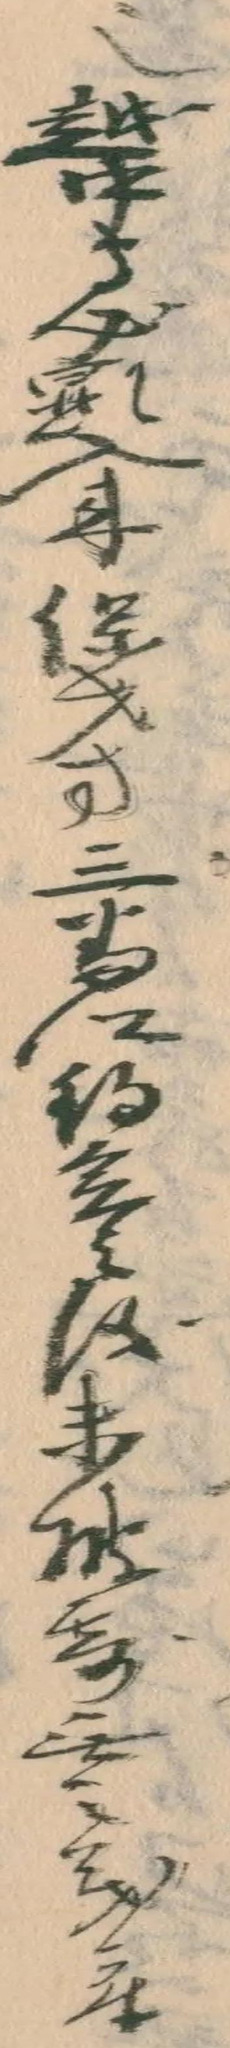也越中守必顕入来保才方三番郷約會之儀未寄無之義ニ付
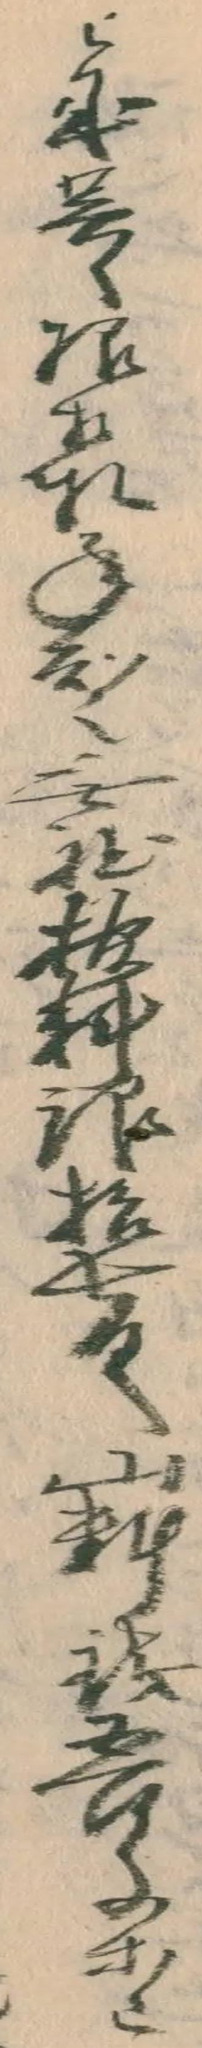被来呉候様相願承知候無程棺料銀拾七匁山耕銭五百文等被
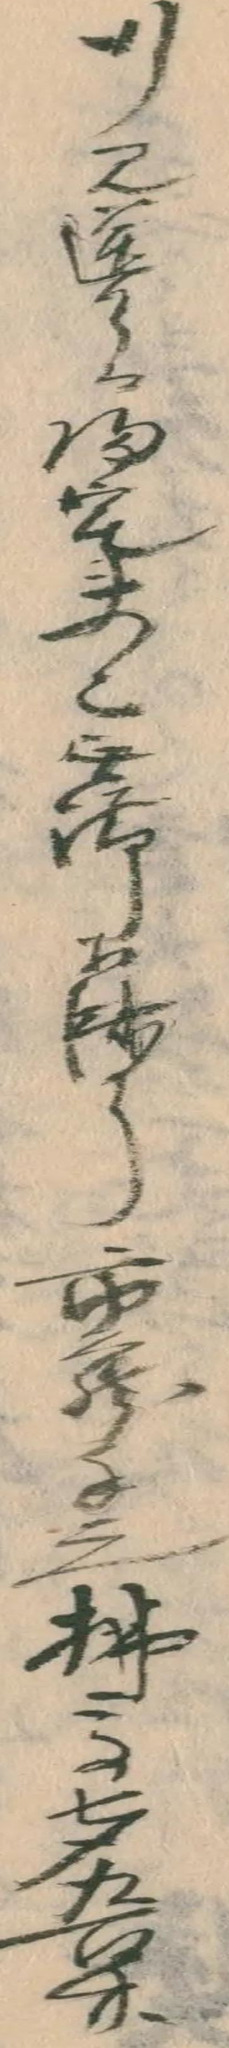行見送り而帰宅夫〻無滞相済了市蔵手之払高七〆九百廿
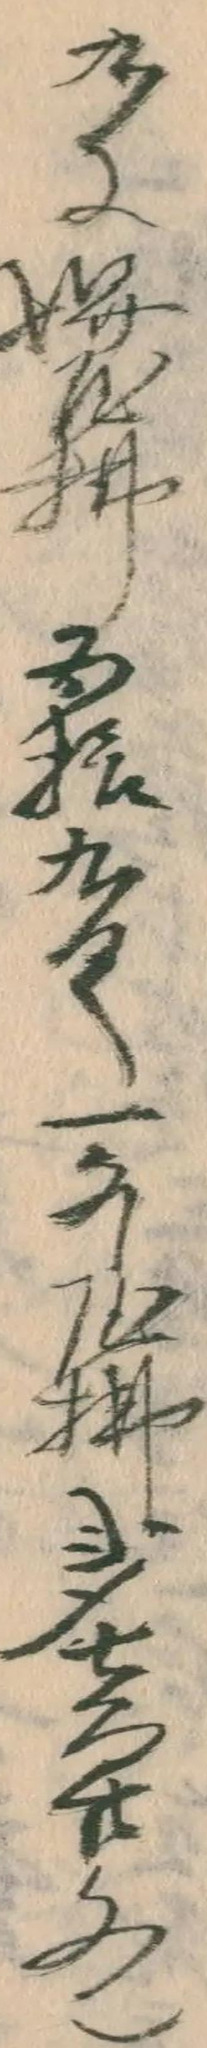九文堺屋払五拾九匁一文屋払弐貫七百廿文也
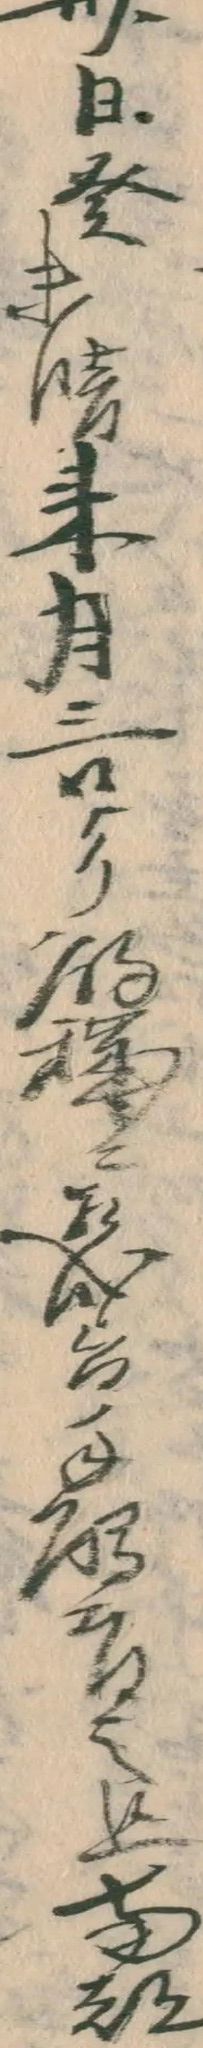卅日癸未晴来月三日より触穢ニ相成旨手觸有之且南都
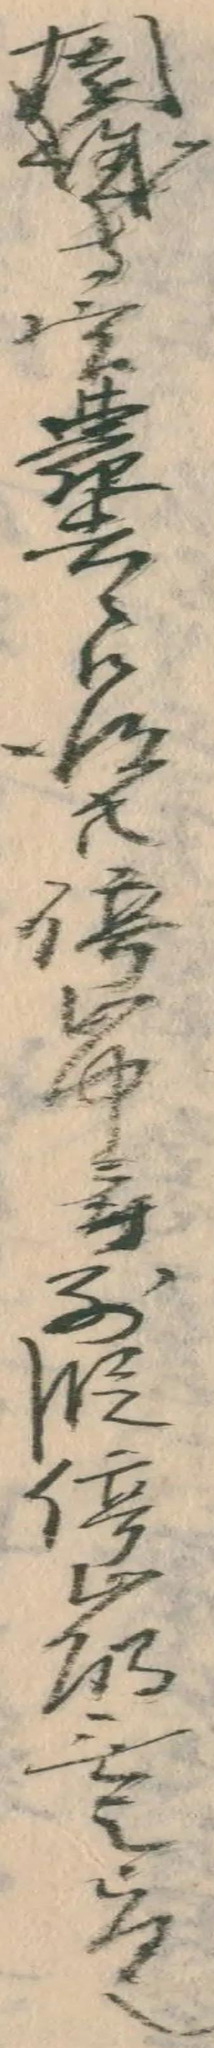園城寺宮薨去に候得共停止中ニ付別段停止觸無之旨也
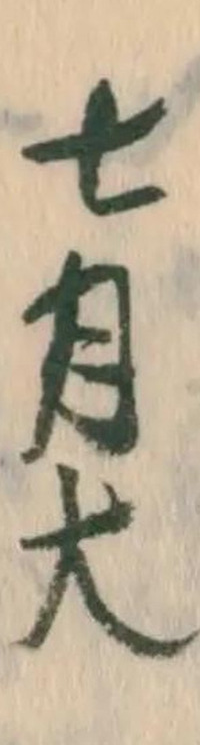七月大
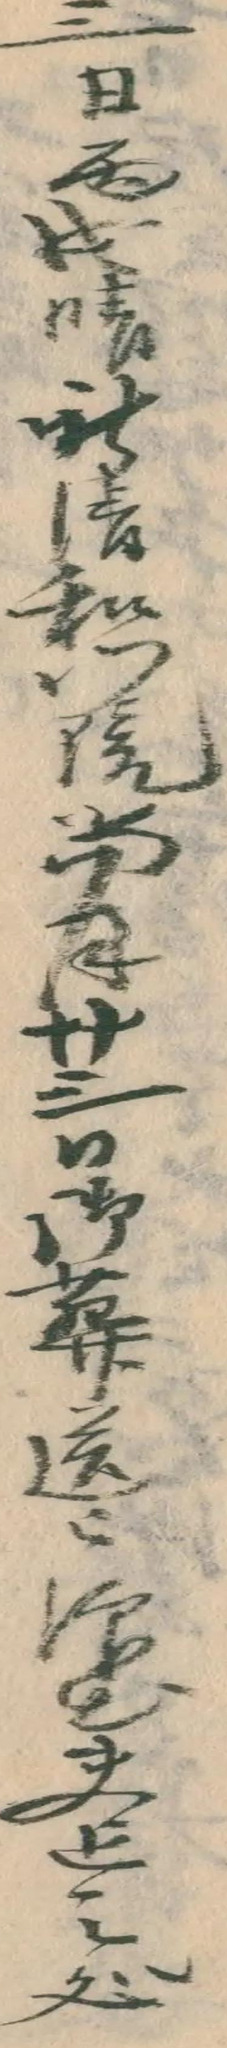三日丙戌晴新清和院當月廿三日御葬送被仰出夫迄之処
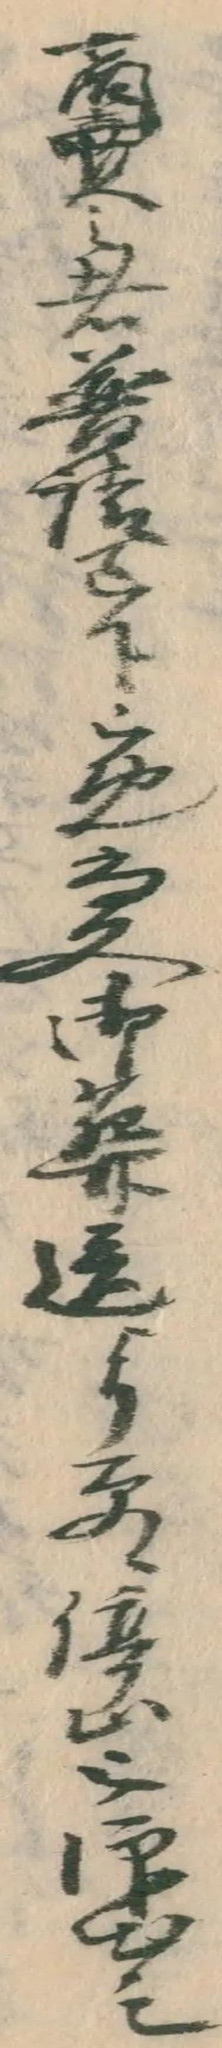商買之者普請已下被免尚又御葬送より受候停止被仰出之
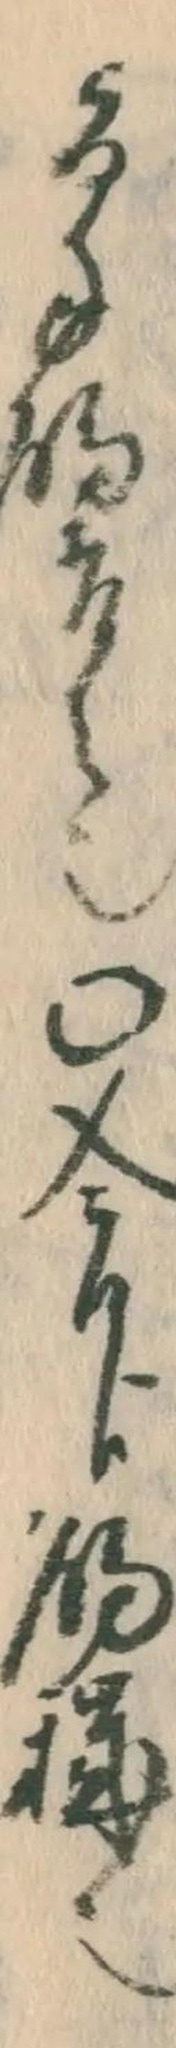旨手觸有之也○今日ゟ觸穢也
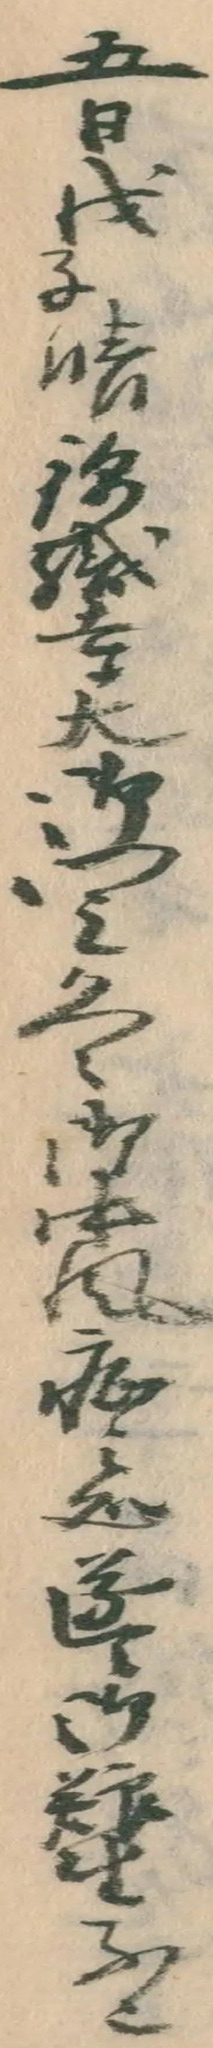五日戊子晴錦織寺大御門主久々御中風病之処遂に御養生不被
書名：賀茂社記録. 第70冊
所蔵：国立国会図書館 National Diet Library, JAPAN
